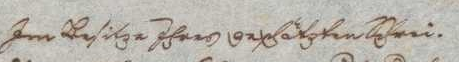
Im Besitze Ihres geschätzten Schrei-
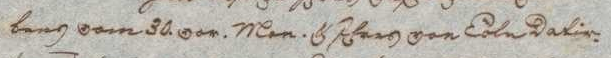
bens vom 30. vor. Mon. & Ihres von Cöln datir-
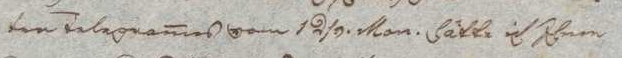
ten Telegrammes vom 1 dss. Mon. hätte ich Ihnen
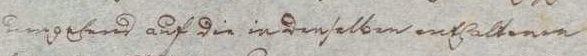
umgehend auf die in denselben enthaltenen
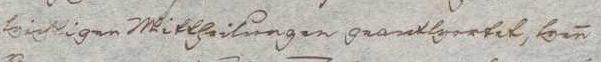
wichtigen Mittheilungen geantwortet, wenn
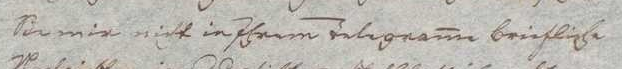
Sie mir nicht in Ihrerm Telegramme briefliche
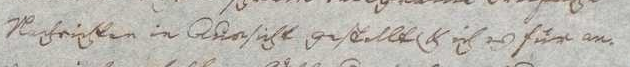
Nachrichten in Aussicht gestellt & ich es für an-
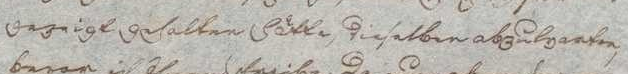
gezeigt gehalten hätte, dieselben abzuwarten,
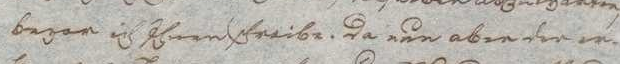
bevor ich Ihnen schreibe. Da nun aber der er-
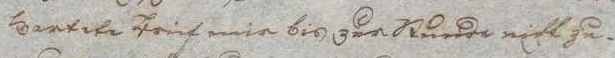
wartete Brief mir bis zur Stunde nicht zu-
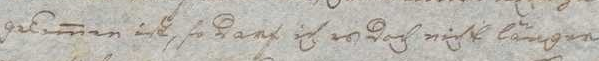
gekommen ist, so darf ich es doch nicht länger
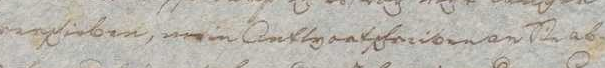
verschieben, mein Antwortschreiben an Sie ab-
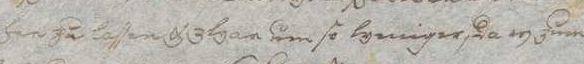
gehen zu lassen & zwar umso weniger, da es zum
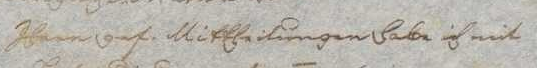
Ihren gef. Mittheilungen habe ich mit
